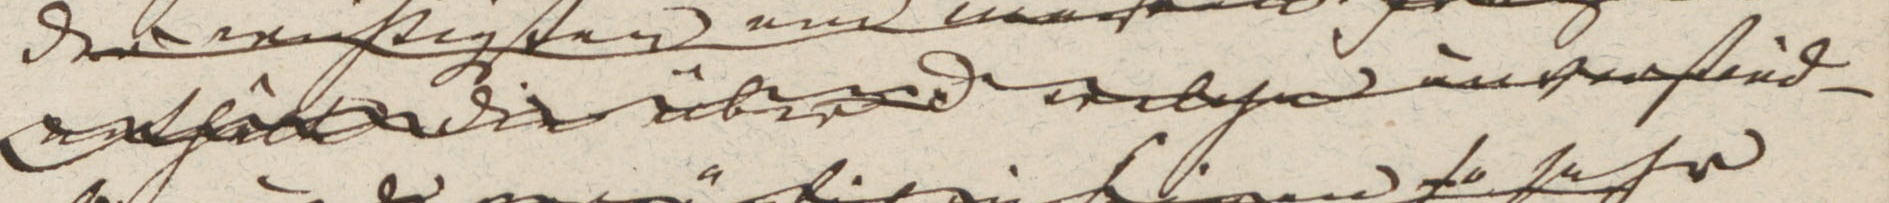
enthlt die über d welche unverständ-
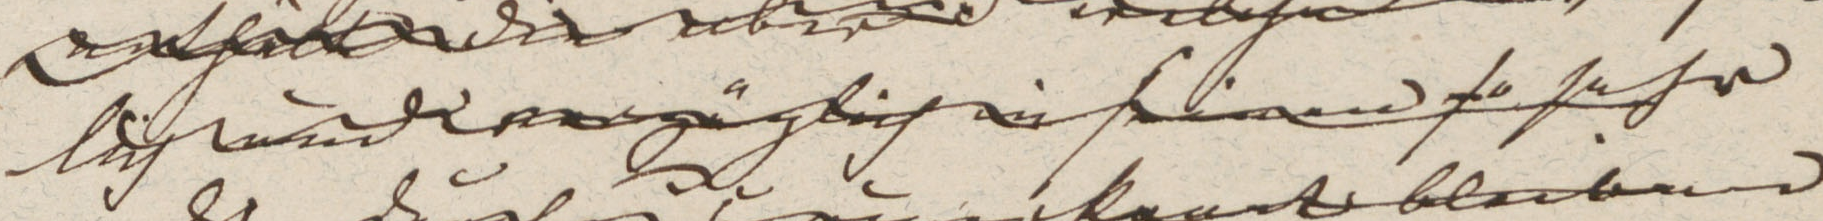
lich und vergänglich in seinen so sehr
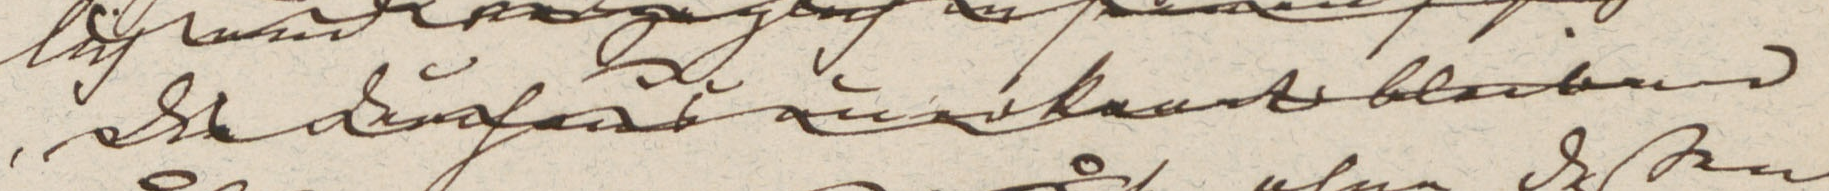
die durchaus unerkannt bleiben
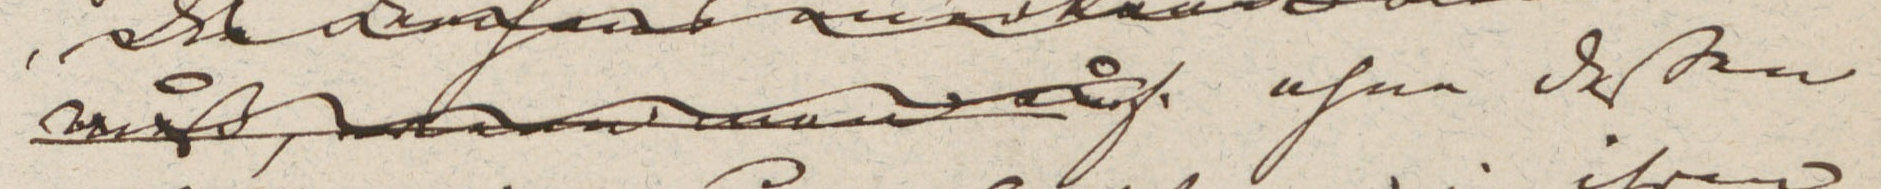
muss, wenn man auf ohne dessen
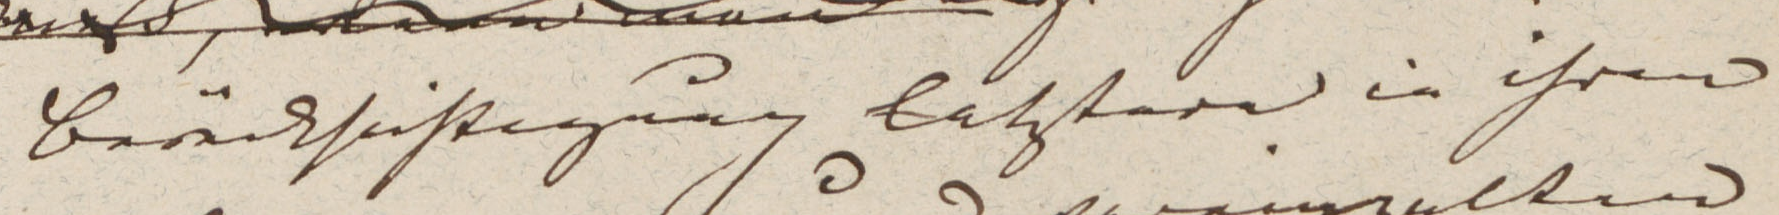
Berücksichtigung letztere in ihren
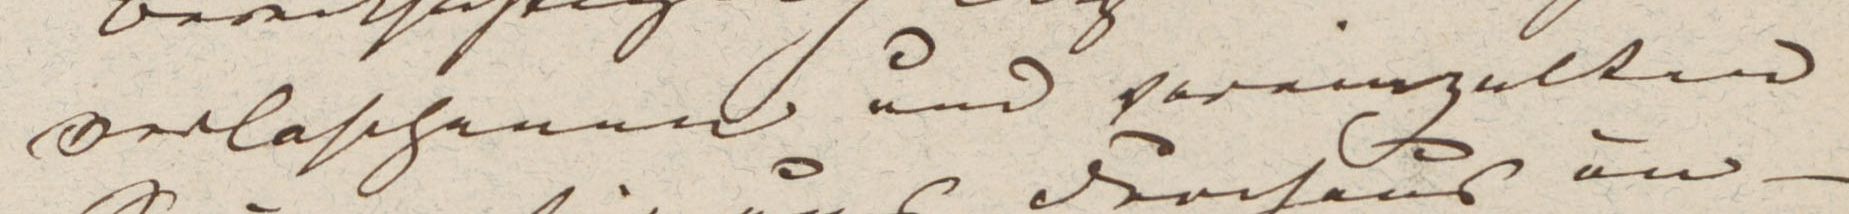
verloschenen und vereinzelten
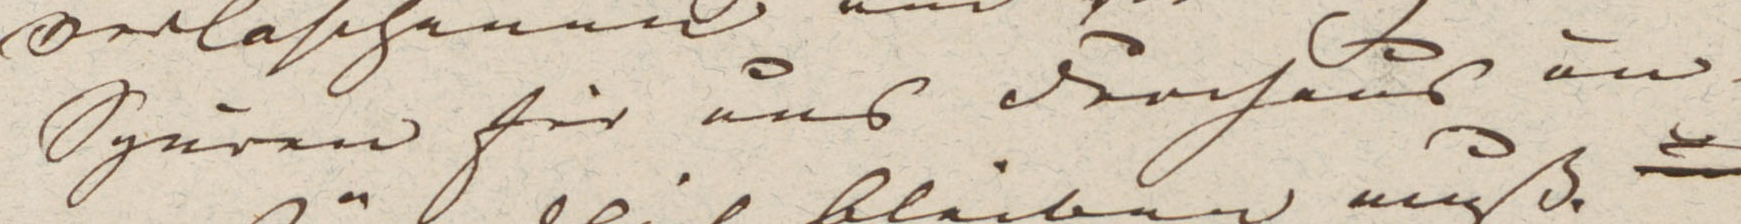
Spuren für uns durchaus un-
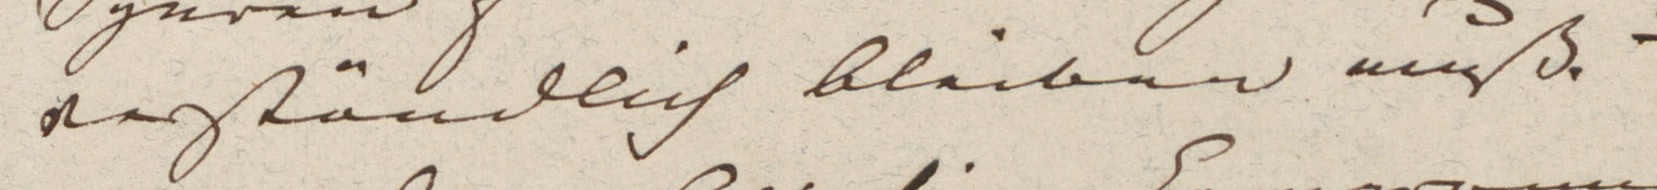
verständlich bleiben muss.
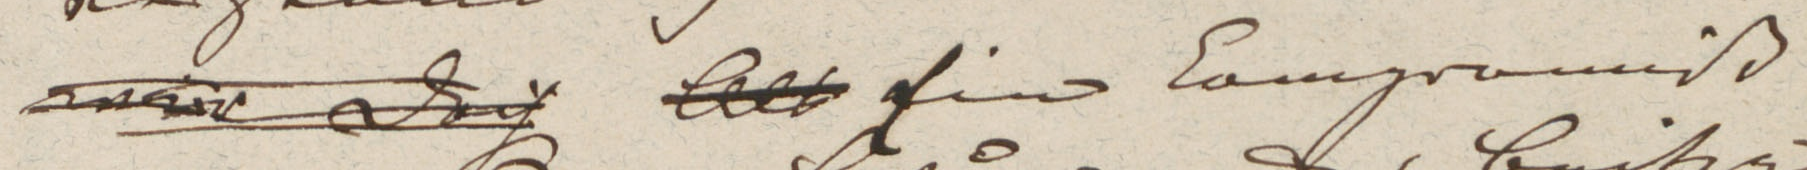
wir Doch Als eEin Compromiss
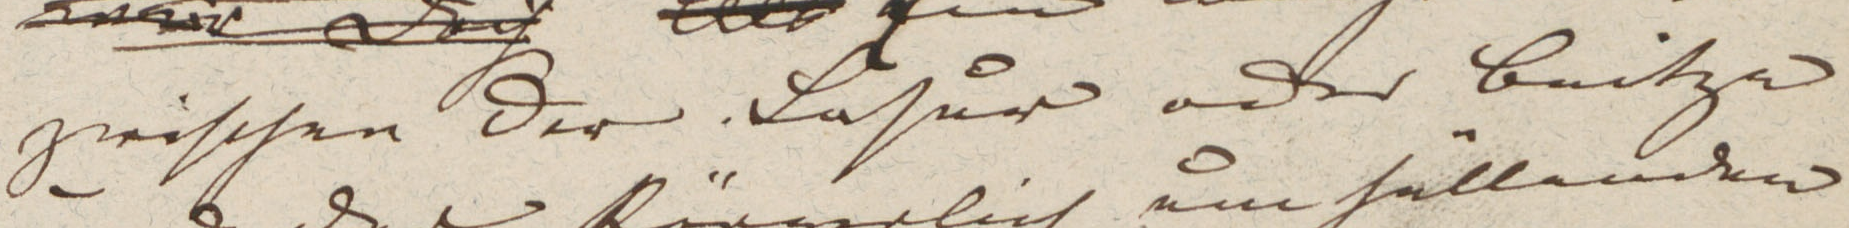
zwischen der Lasur oder Beitze
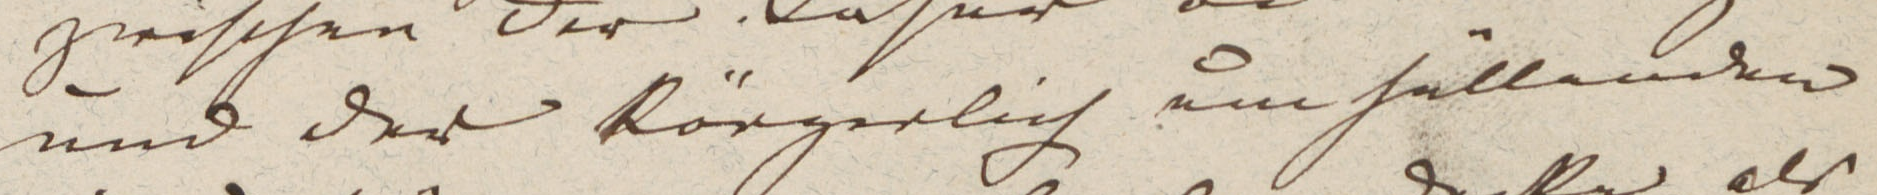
und der körperlich umhüllenden
